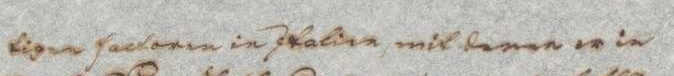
tigen Factoren in Italien, mit denen er in
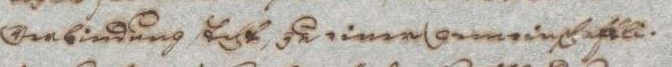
Verbindung steht, zu einer gemeinschaftli-
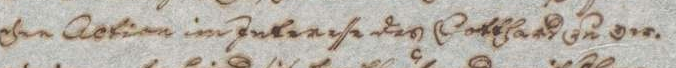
chen Action im Interesse des Gotthard zu ver-
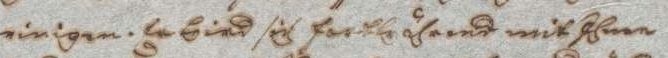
einigen. Er wird sich fortwährend mit Ihnen
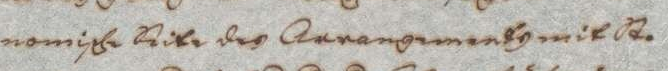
nomische Seite des Arrangements mit St.
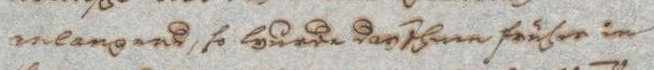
anlangend, so wurde das Ihnen früher in
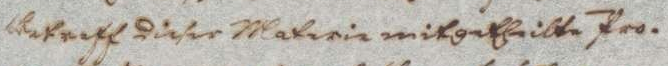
Betreff dieser Materie mitgetheilte Pro-
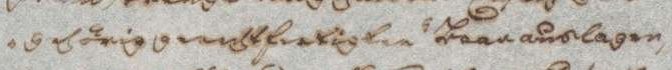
«gehörig gerechtfertigten» Baarauslagen,
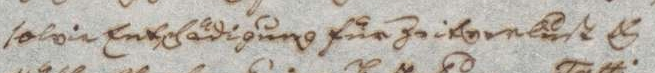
sowie Entschädigung für Zeitverlust &
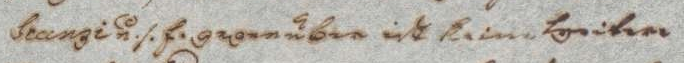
Scanzi u. s. f. gegenüber ist keine weitere
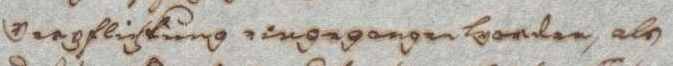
Verpflichtung eingegangen worden, als
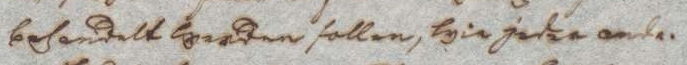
behandelt werden sollen, wie jeder ande-
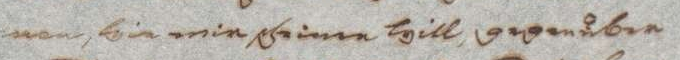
man, wie mir scheinen will, gegenüber
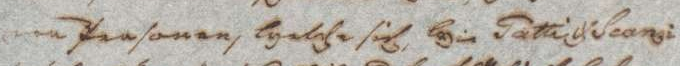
von Personen, welche sich, wie Tatti & Scanzi
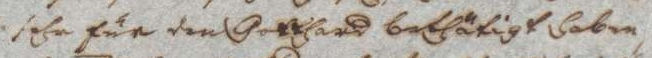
sehr für den Gotthard bethätigt haben,
